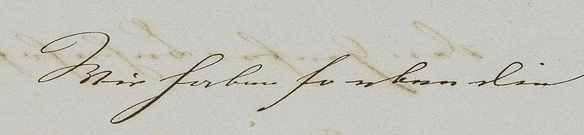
Wir haben so eben die
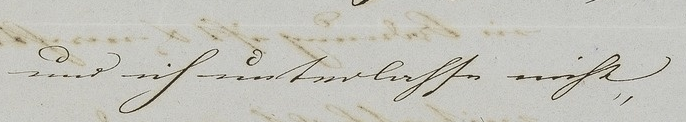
und ich unterlasse nicht,
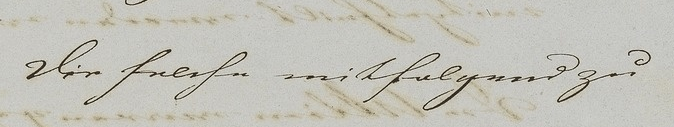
Dir solche mitfolgend zu
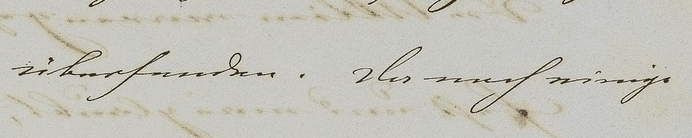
übersenden. Da noch einige
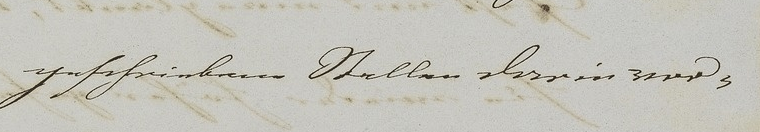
geschriebene Stellen darin vor-
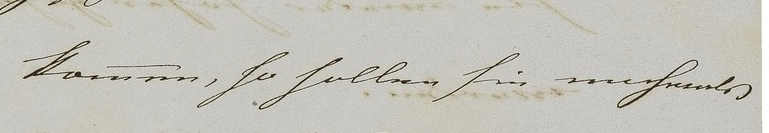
kommen, so sollen sie nochmals
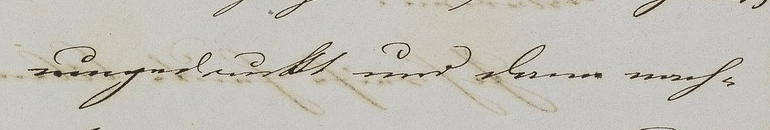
umgedruckt und dann nach-
